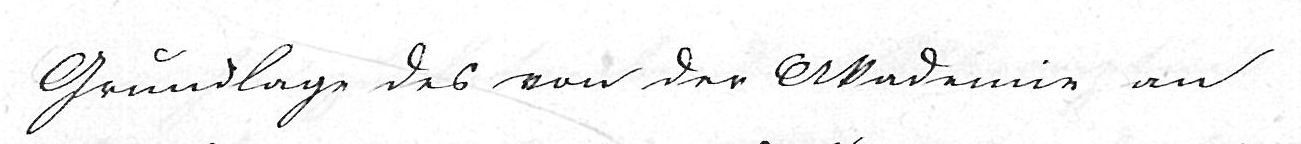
Grundlage des von der Akademie an
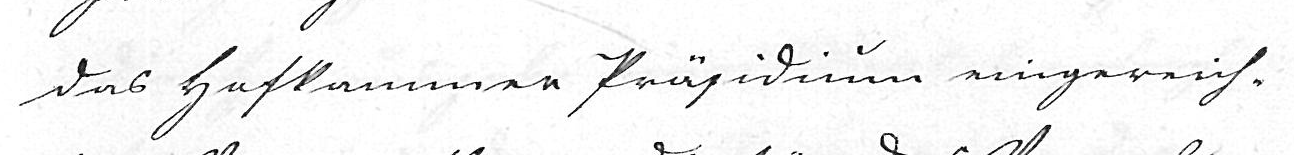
das Hofkammer Präsidium eingereich-
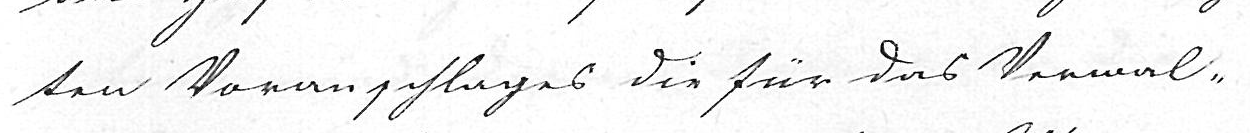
ten Voranschlages die für das Verwal-
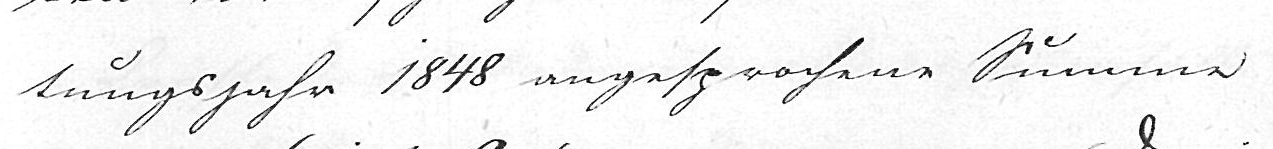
tungsjahr 1848 angesprochene Summe
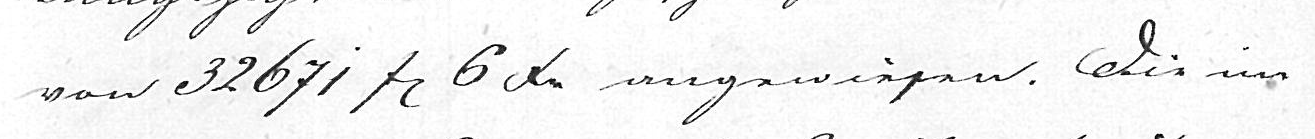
von 32671 fr 6 kr angewiesen. Die im
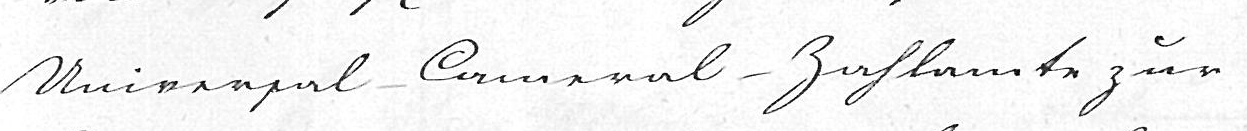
Universal-Cameral-Zahlamte zur
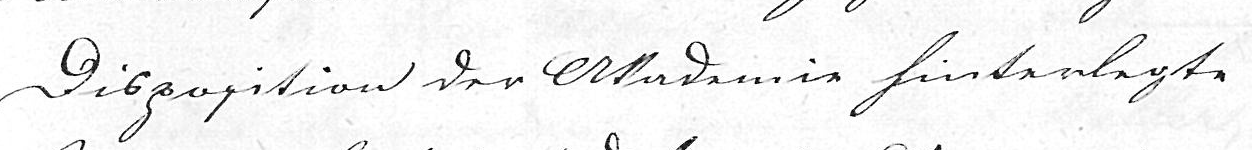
Disposition der Akademie hinterlegte
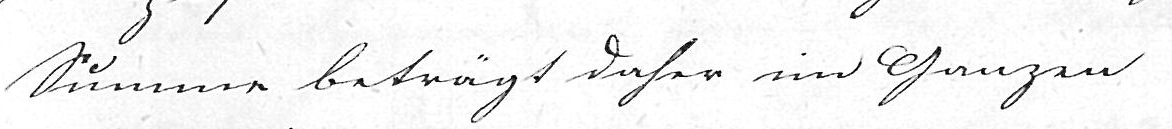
Summe beträgt daher im Ganzen
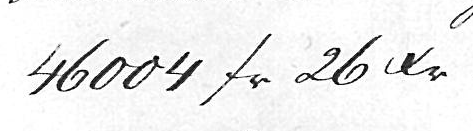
46004 fr 26 kr.
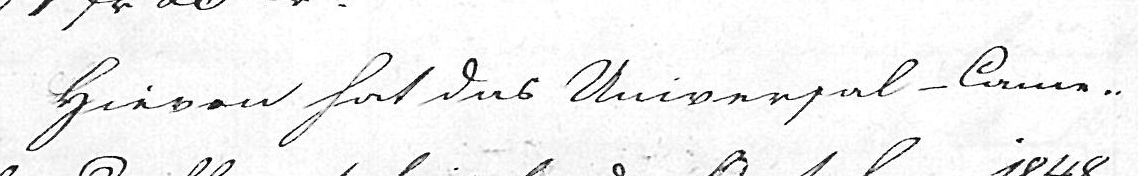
Hiervon hat des Universal-Came-
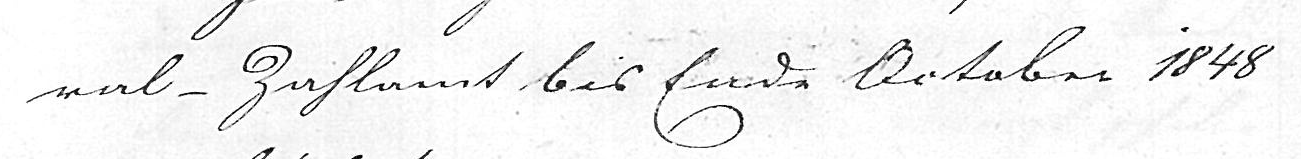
ral-Zahlamt bis Ende October 1848
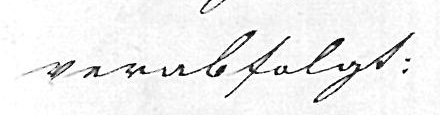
verabfolgt:
